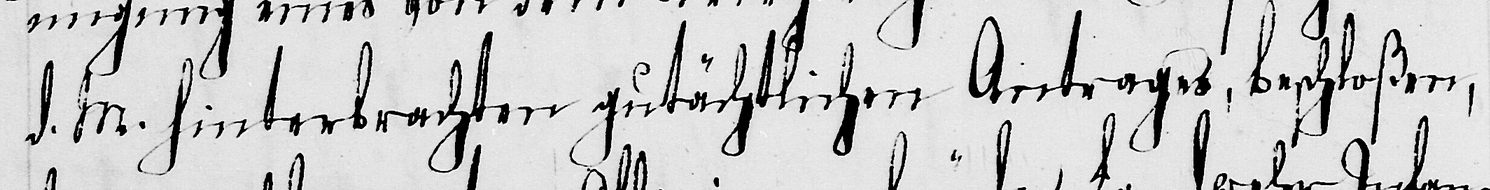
d. M. hinterbrachten gutächtlichen Antrages, beschloßen,
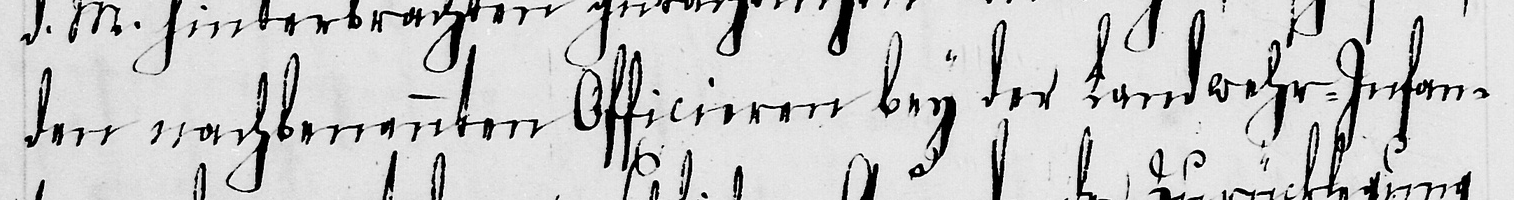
den nachbenannten Officieren bey der Landwehr-Infan¬
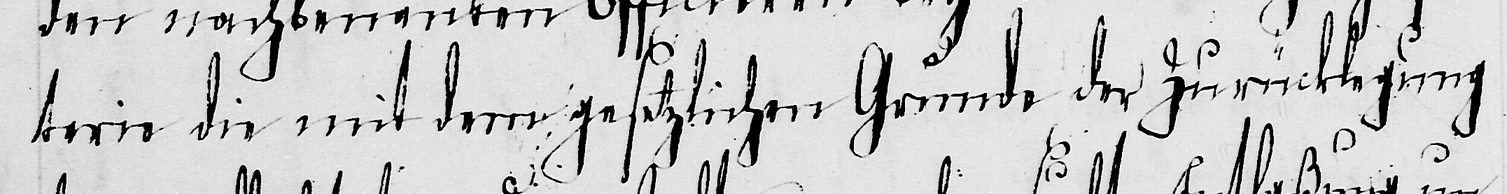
terie die mit dem gesetzlichen Grunde der Zurücklegung
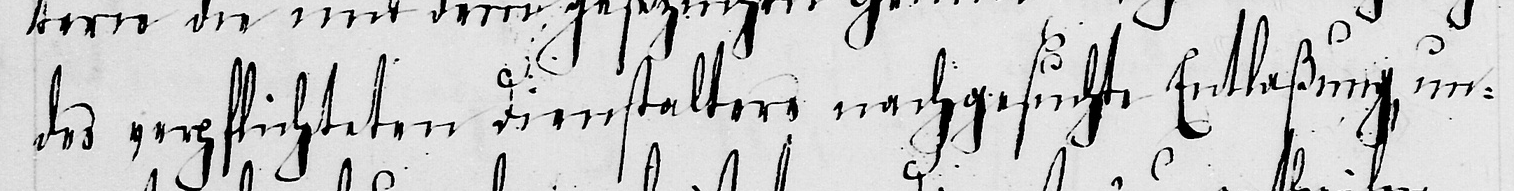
des verpflichteten Dienstalters nachgesuchte Entlaßung, un¬
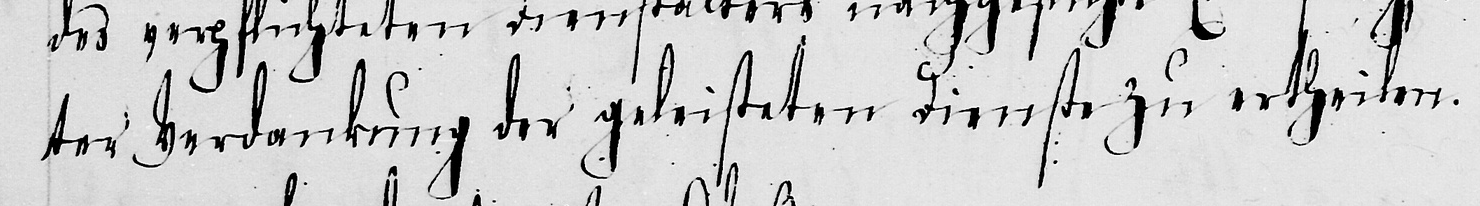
ter Verdankung der geleisteten Dienste zu ertheilen.
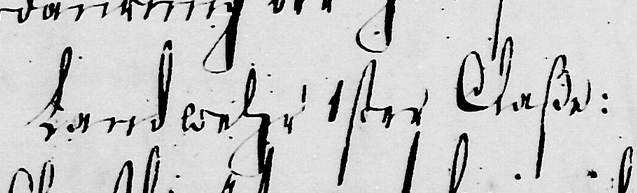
Landwehr 1ster Claße:
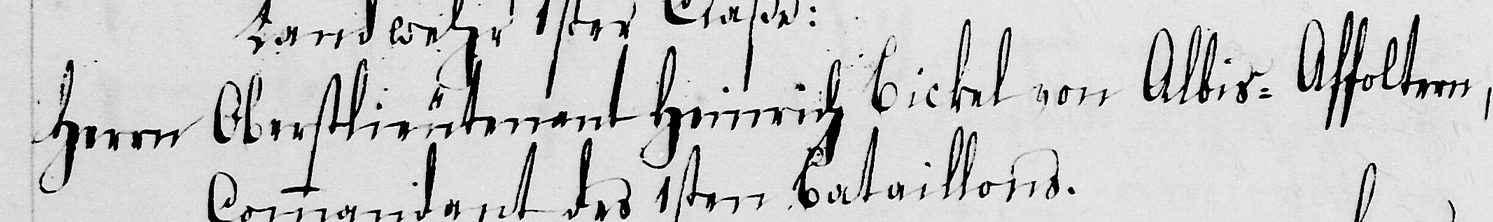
Herrn Oberstlieutenant Heinrich Bickel von Albis-Affolte¬
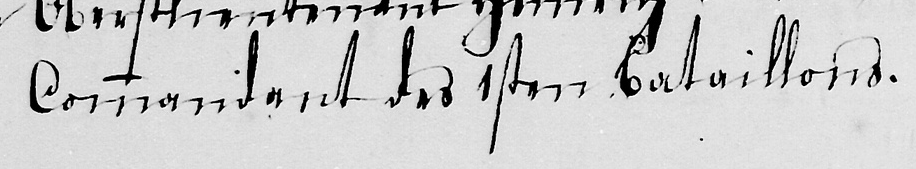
Commandant des 1sten Bataillons.
